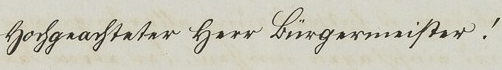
Hochgeachteter Herr Bürgermeister!
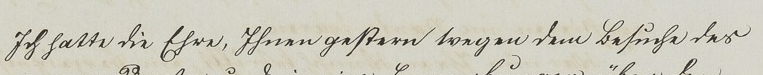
Ich hatte die Ehre, Ihnen gestern wegen dem Besuche des
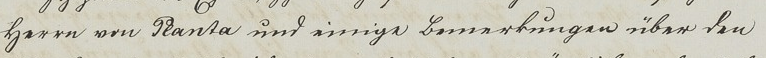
Herrn von Planta und einige Bemerkungen über den
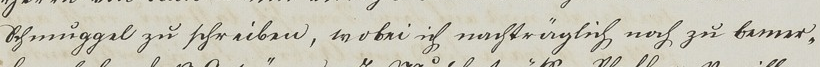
Schmuggel zu schreiben, wobei ich nachträglich noch zu bemer-
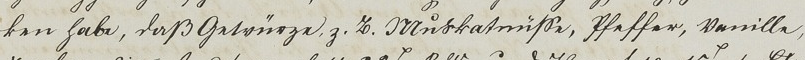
ken habe, daß Gewürze, z. B. Muskatnüsse, Pfeffer, Vanille,
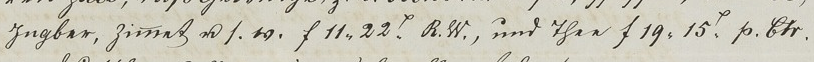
Ingber, Zimmet &s. w. f 11-22 ... R.W. , und Thee f 19-15 ... p. Ctr.
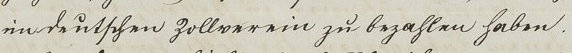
im deutschen Zollverein zu bezahlen haben.
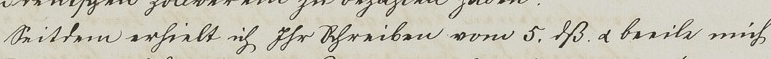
Seitdem erhielt ich Ihr Schreiben vom 5. dß. & beeile mich
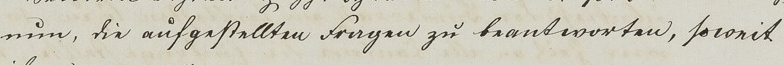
nun, die aufgestellten Fragen zu beantworten, soweit
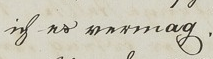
ich es vermag.
